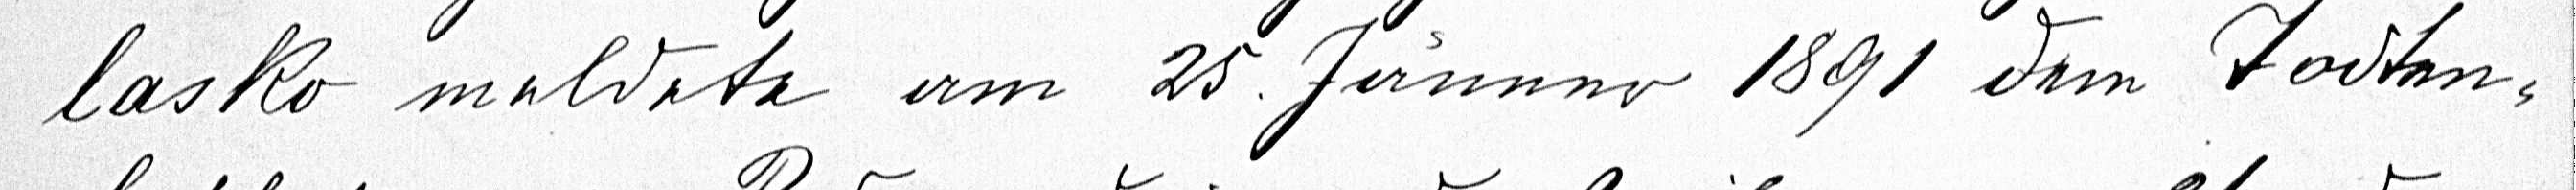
lasko meldete am 25. Jänner 1891 dem Todten¬
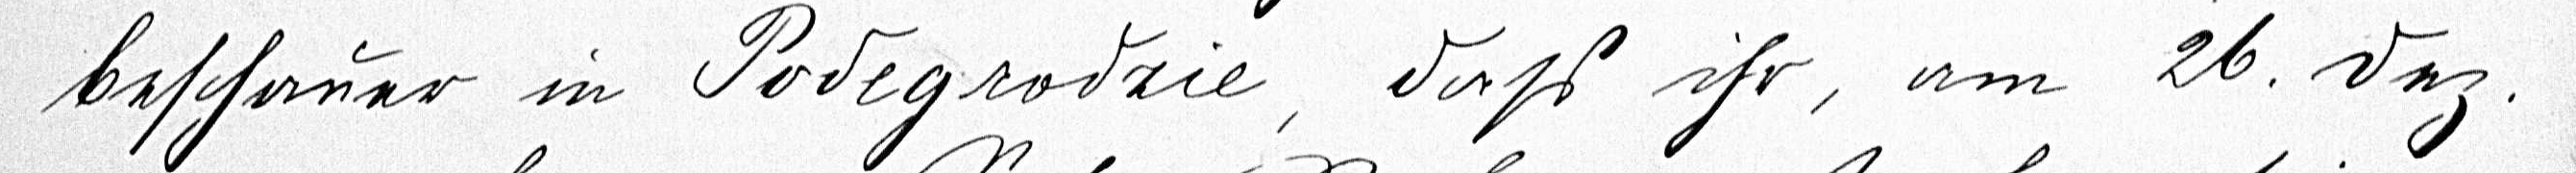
beschauer in Podegrodzie, daß ihr, am 26. Dez.
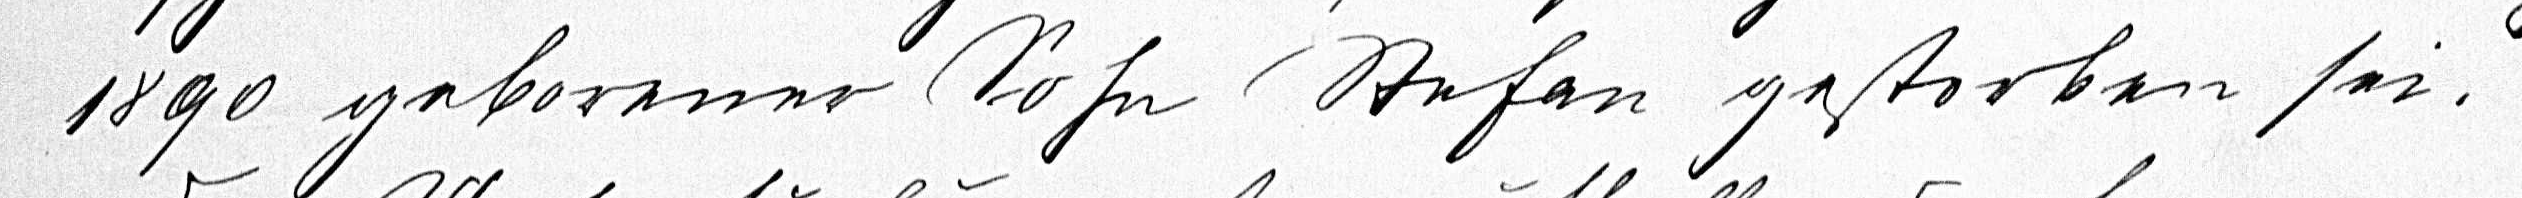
1890 geborener Sohn Stefan gestorben sei.
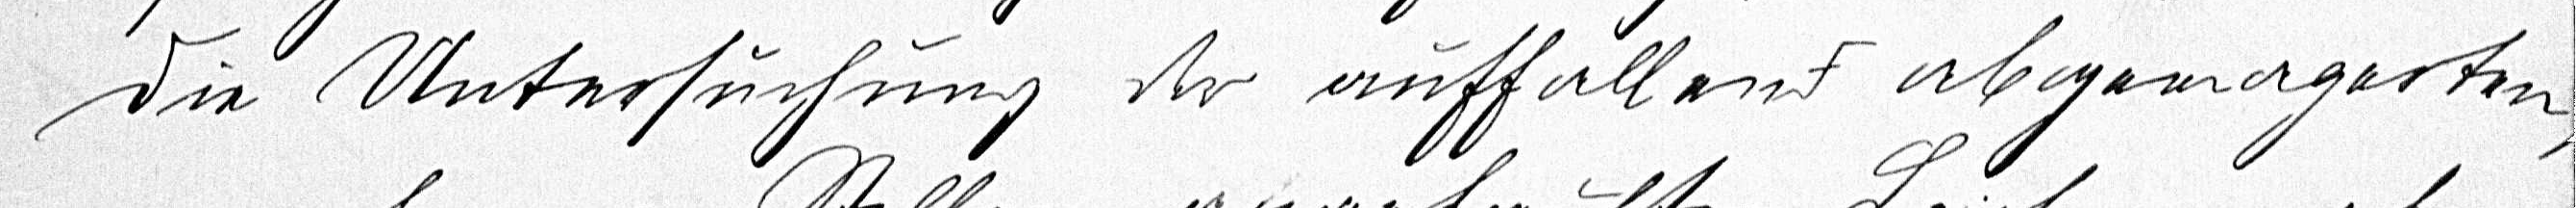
Die Untersuchung der auffallend abgemagerten,
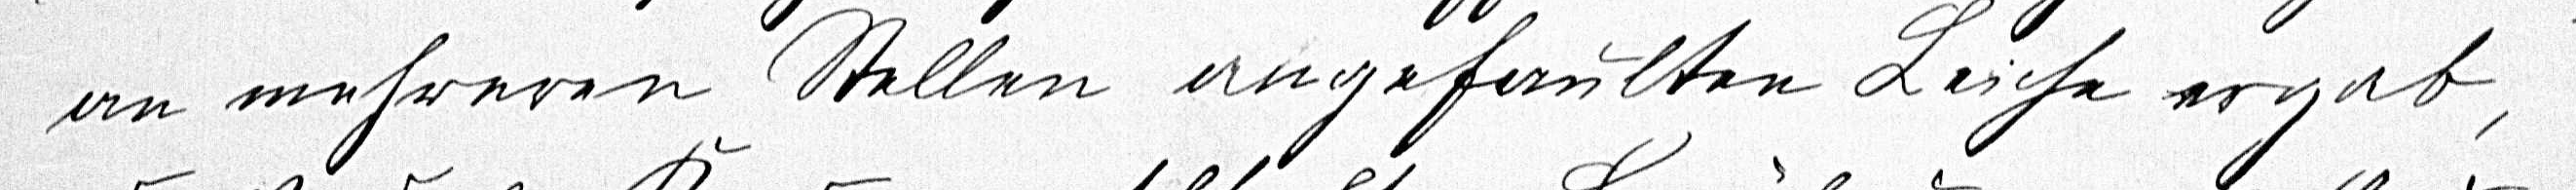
an mehreren Stellen angefaulten Leiche ergab,
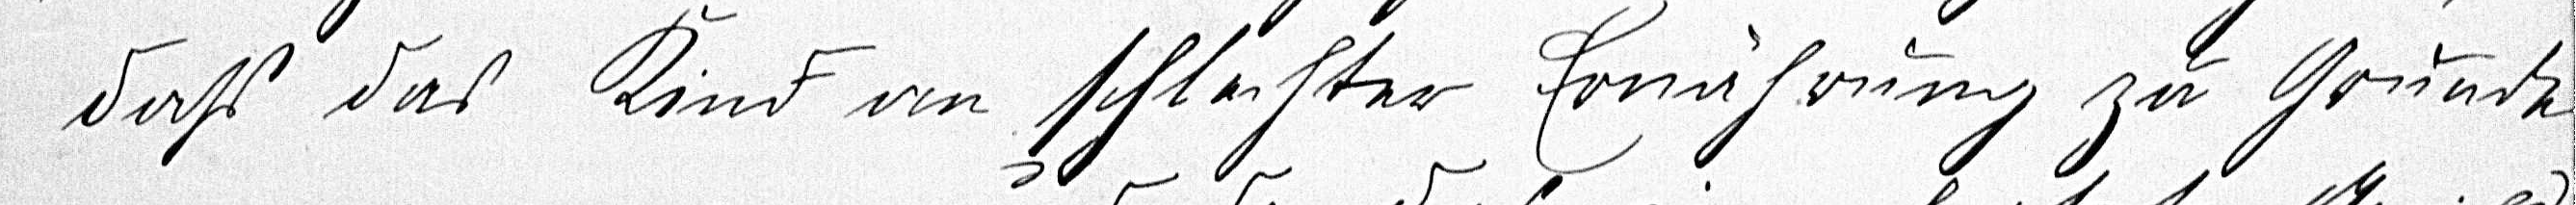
daß das Kind an schlechter Ernährung zu Grunde
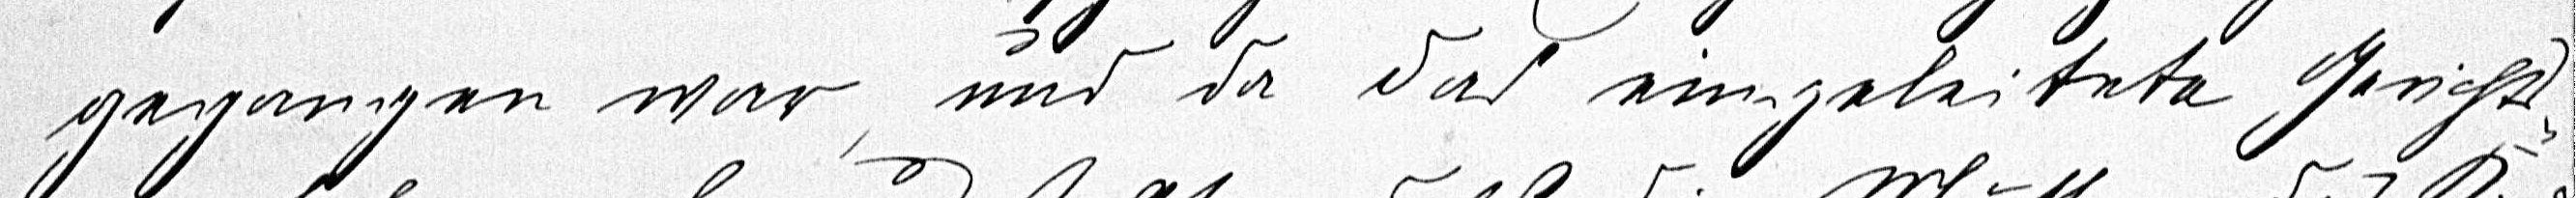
gegangen war, und da das eingeleitete Gerichts¬
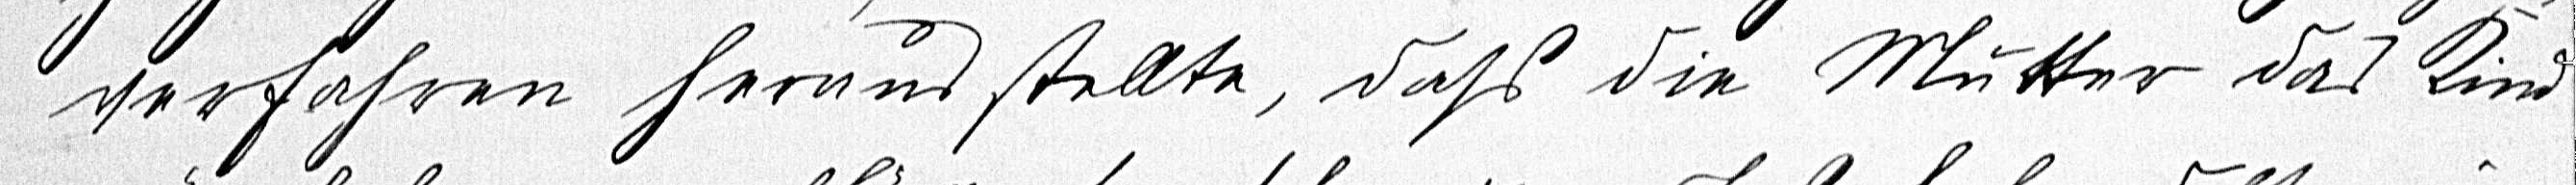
verfahren herausstellte, daß die Mutter das Kind
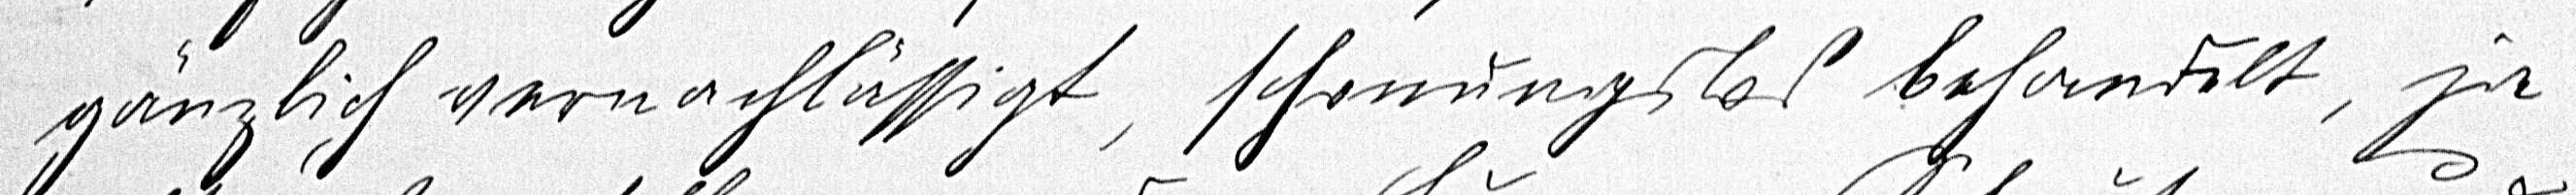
gänzlich vernachlässigt, schonungslos gehandelt, ja
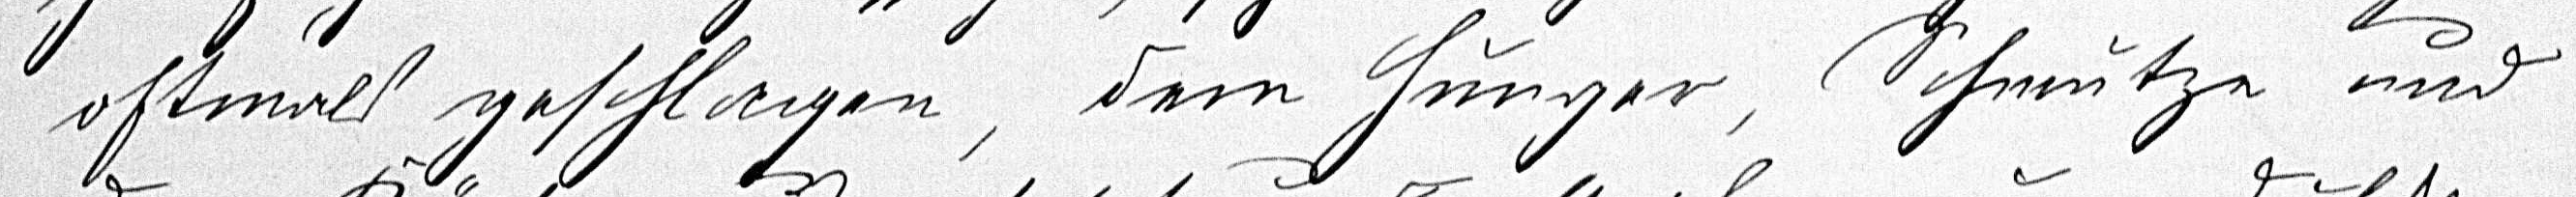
oftmals geschlagen, dem Hunger, Schmutze und
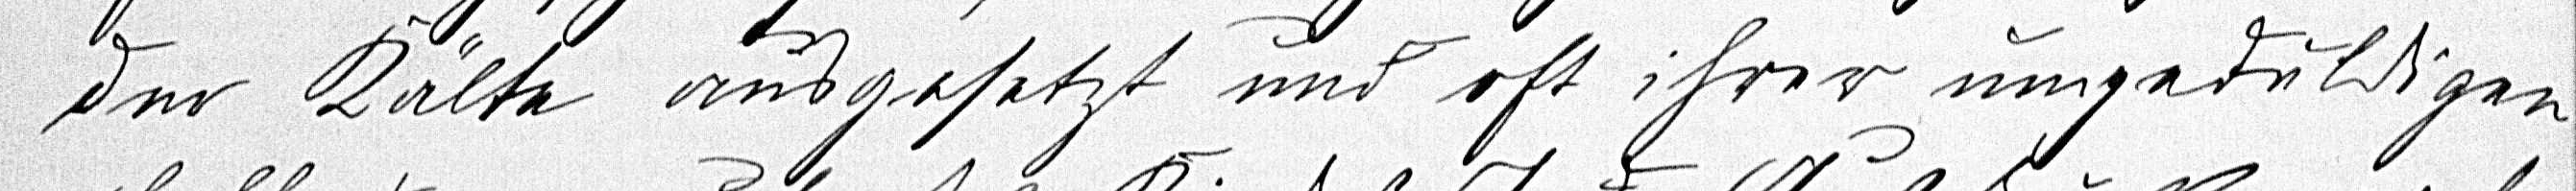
der Kälte ausgesetzt und oft ihrer ungeduldigen
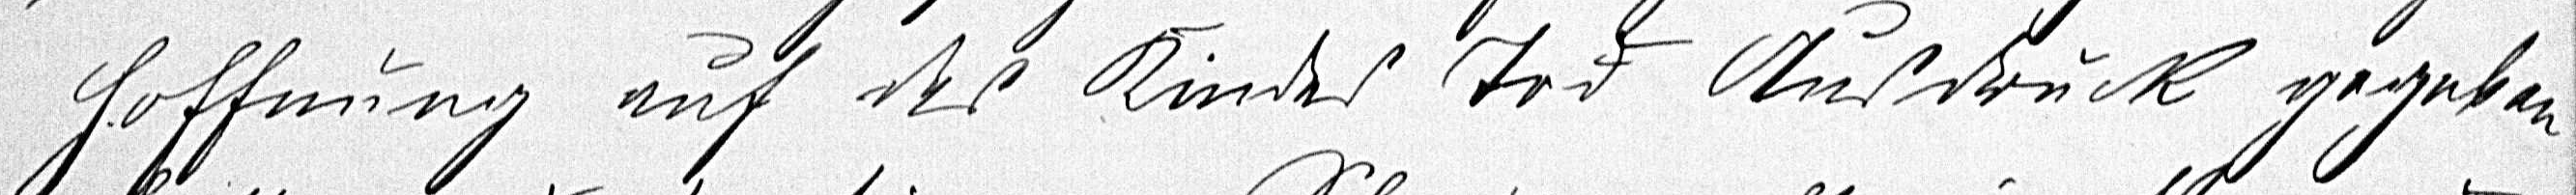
Hoffnung auf das Kindes Tod Ausdruck gegeben
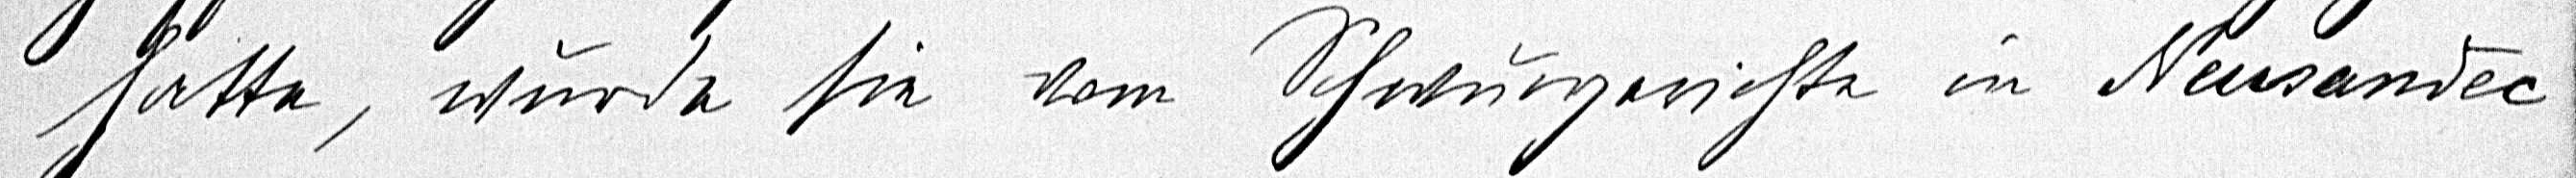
hatte, wurde sie vom Schwurgerichte in Neusandec
